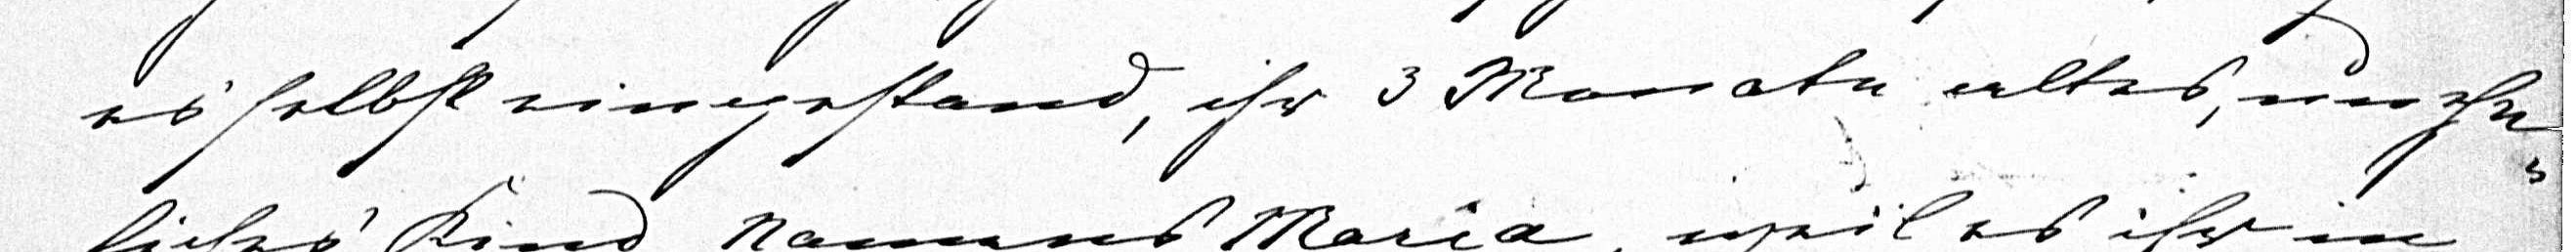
es selbst eingestand, ihr 3 Monate altes, unehe¬
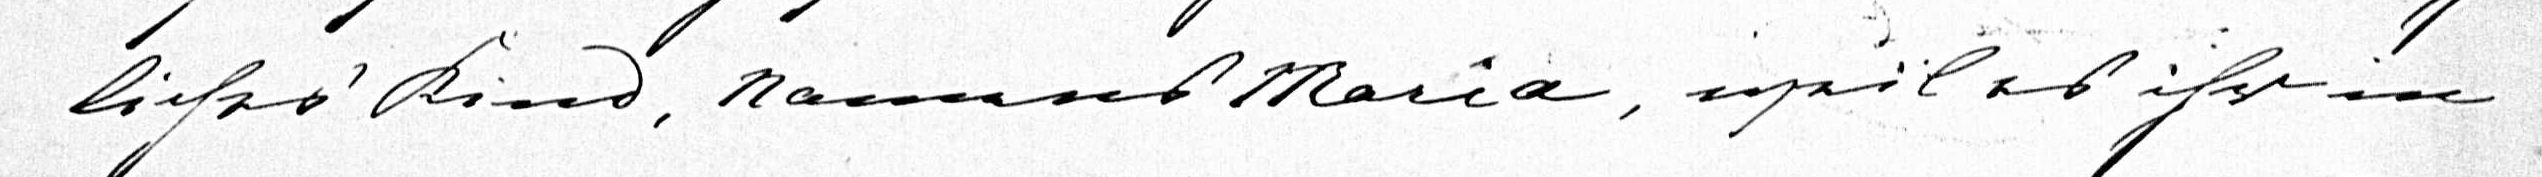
liches Kind, Namens Maria, weil es in
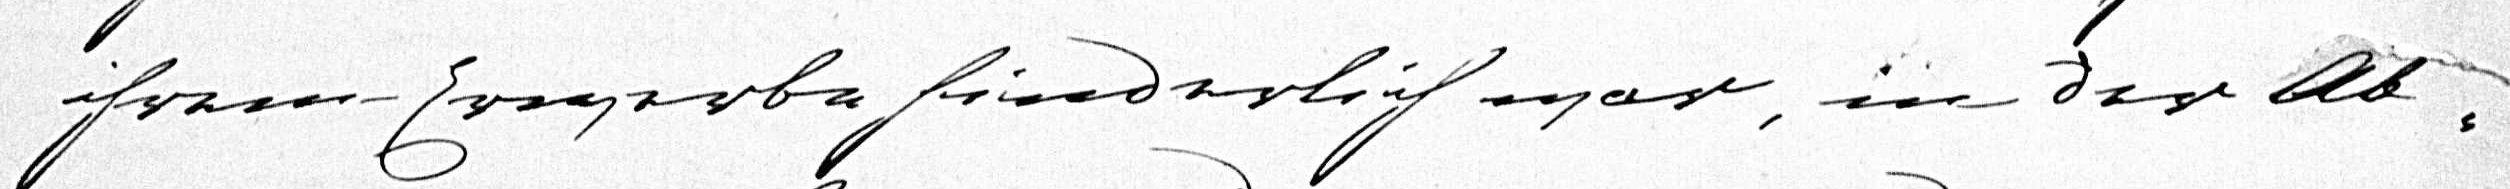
ihrem Erwerbe hinerlich war, in der Ab¬
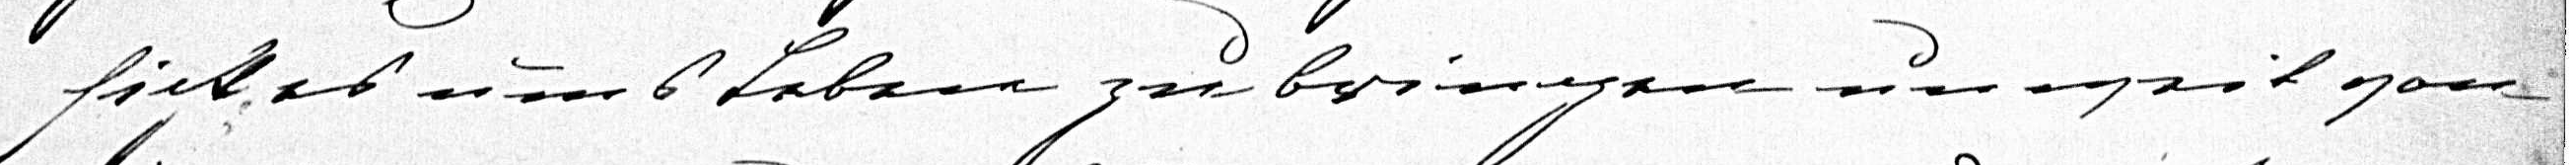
sicht es ums Leben zu bringen unweit von
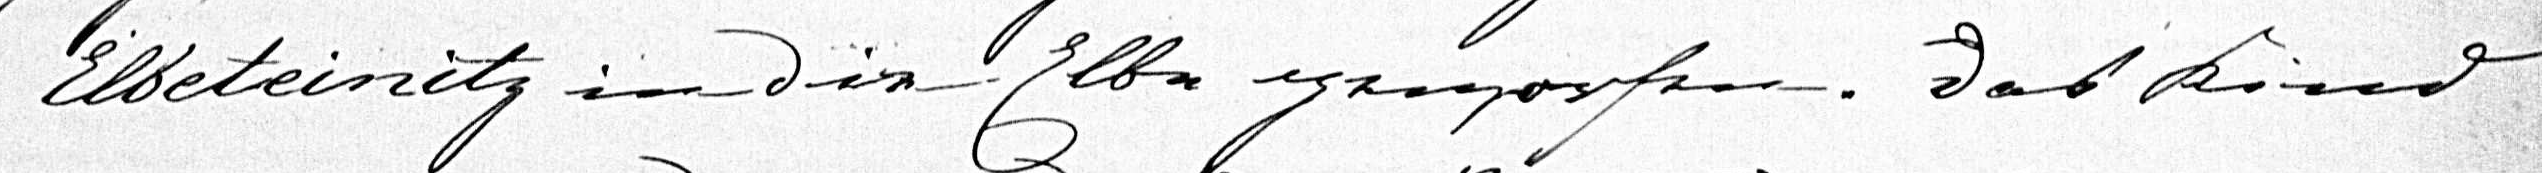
Elbeteinitz in die Elbe geworfen. Das Kind
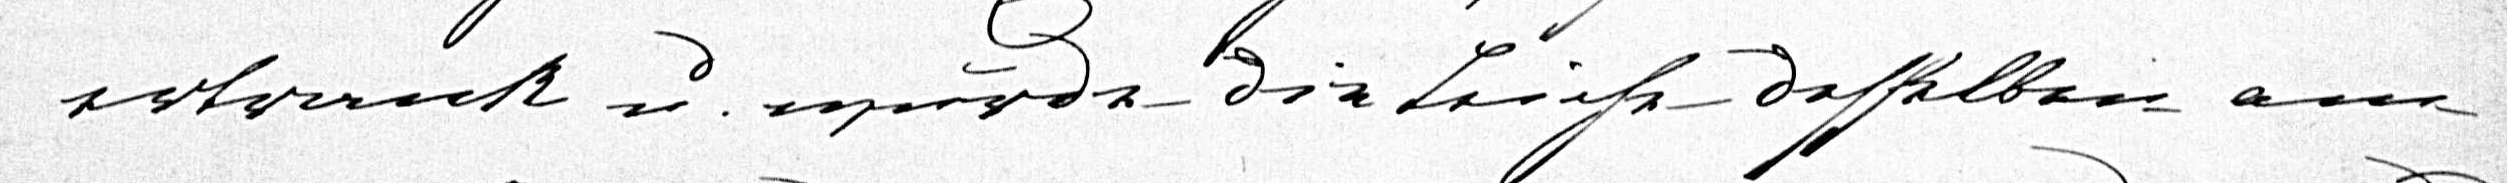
ertrank u. wurde die Leiche desselben am
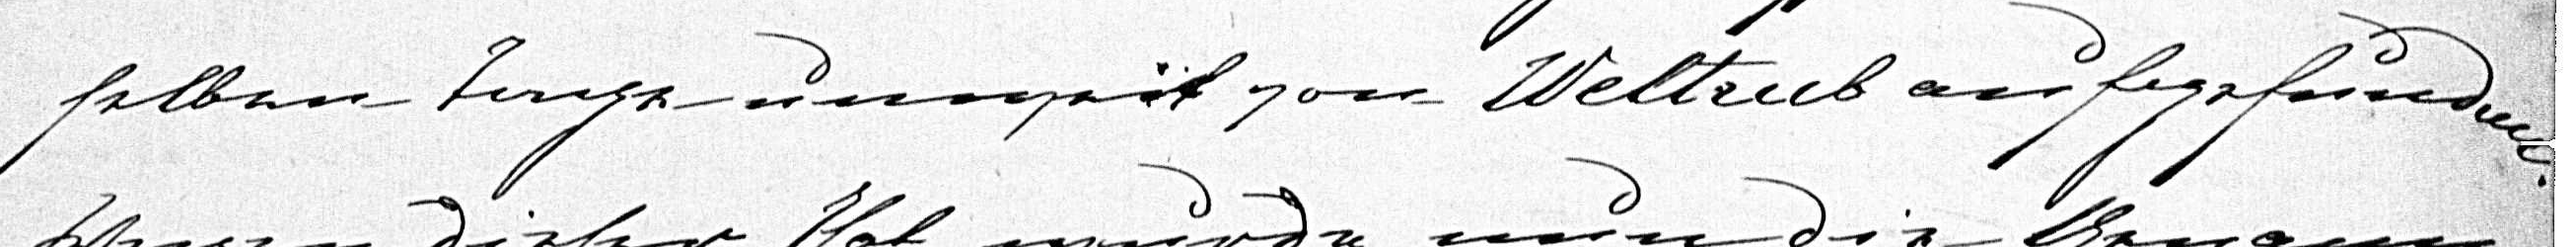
selben Tage unweit von Weltrub aufgefunden.
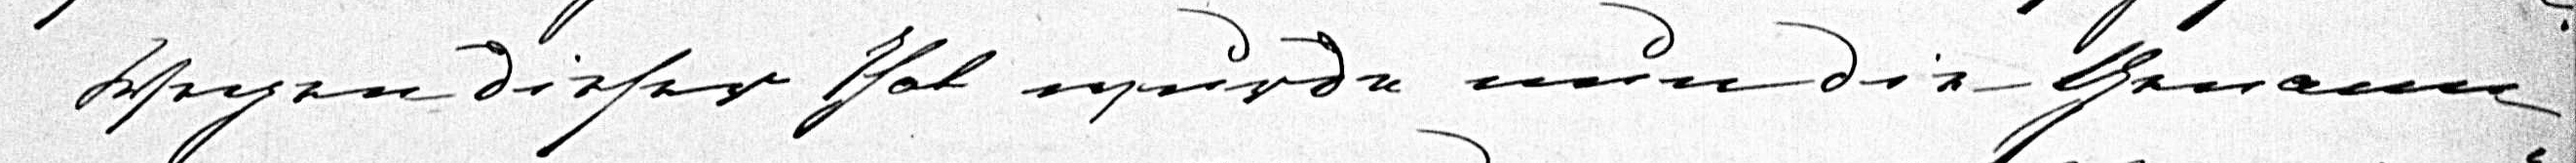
Wegen dieser That wurde nun die Genannte
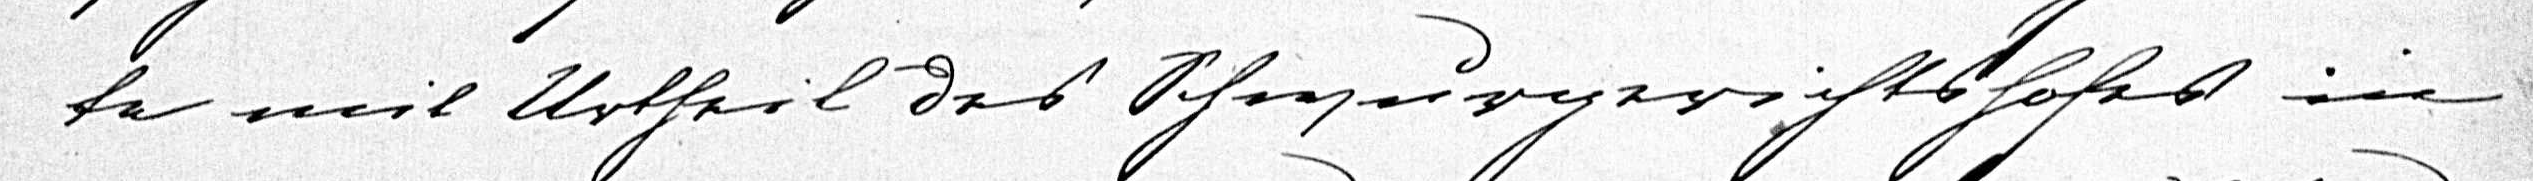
mit Urtheil des Schwurgerichtshofes in
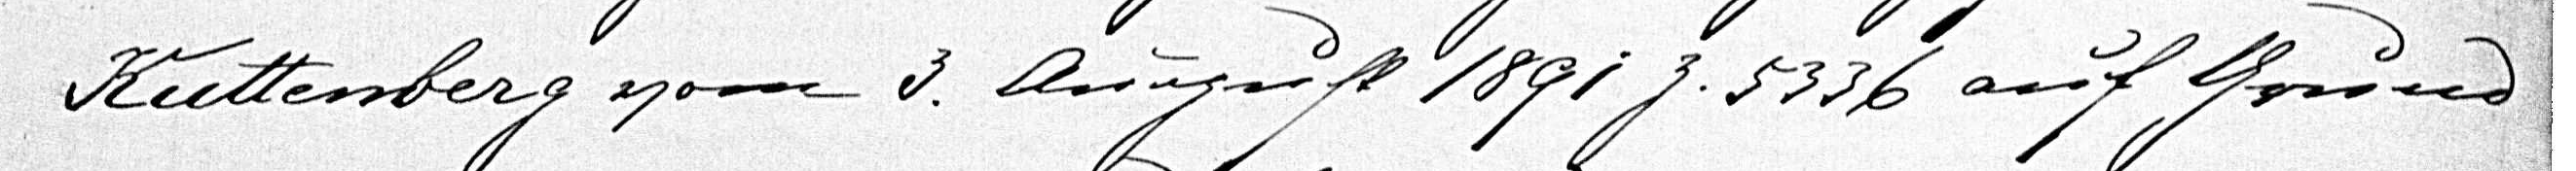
Kuttenberg vom 3. August 1891 Z 5336 auf Grund
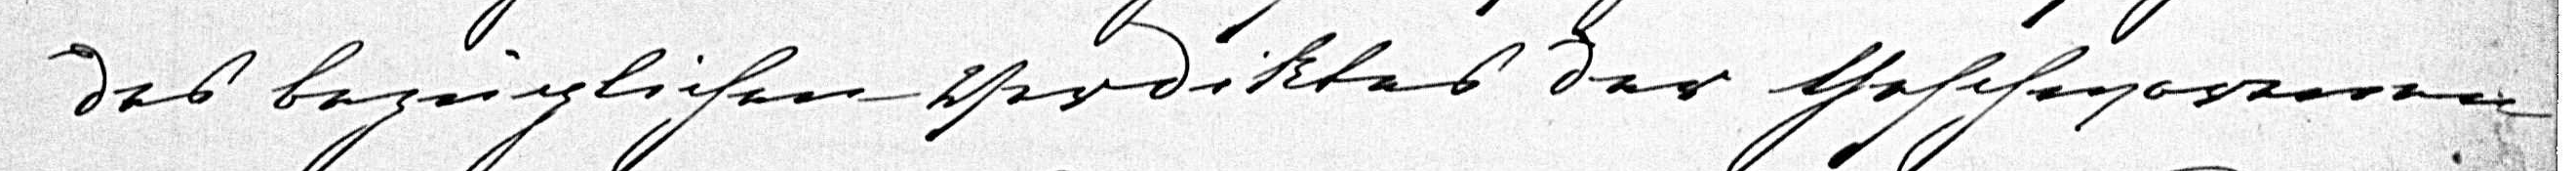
des bezüglichen Verdiktes der Geschworenen
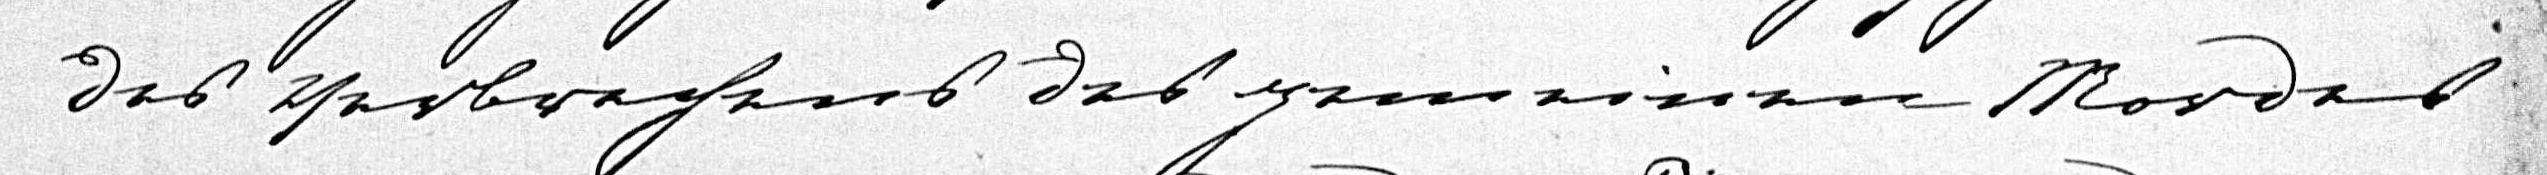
des Verbrechens des gemeinen Mordes
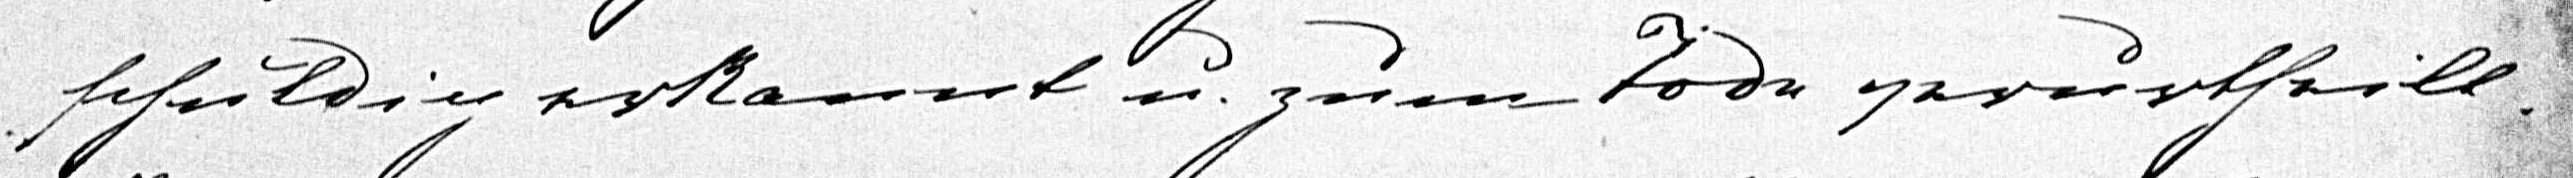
schuldig erkannt u. zum Tode verurtheilt.
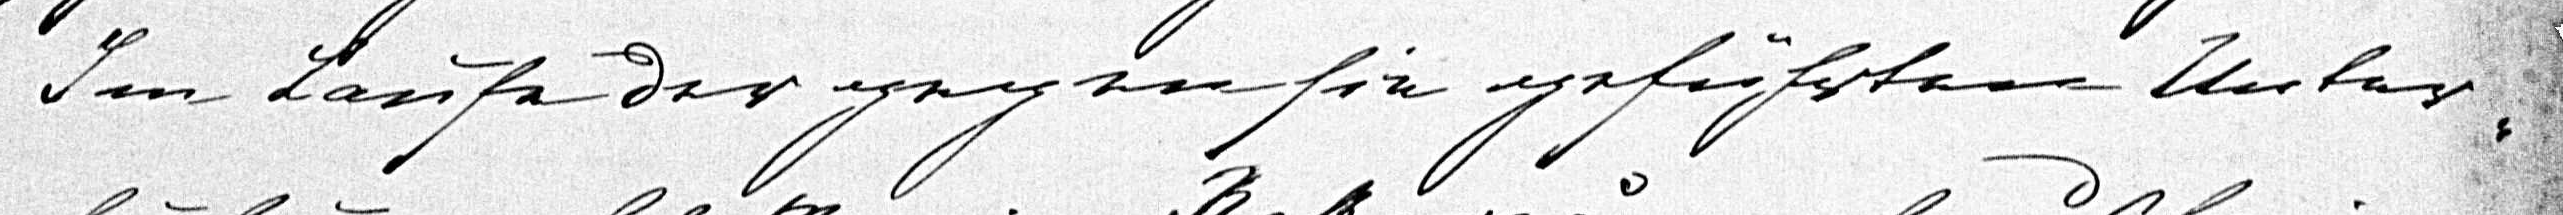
Im Laufe der gegen sie geführte Unter¬
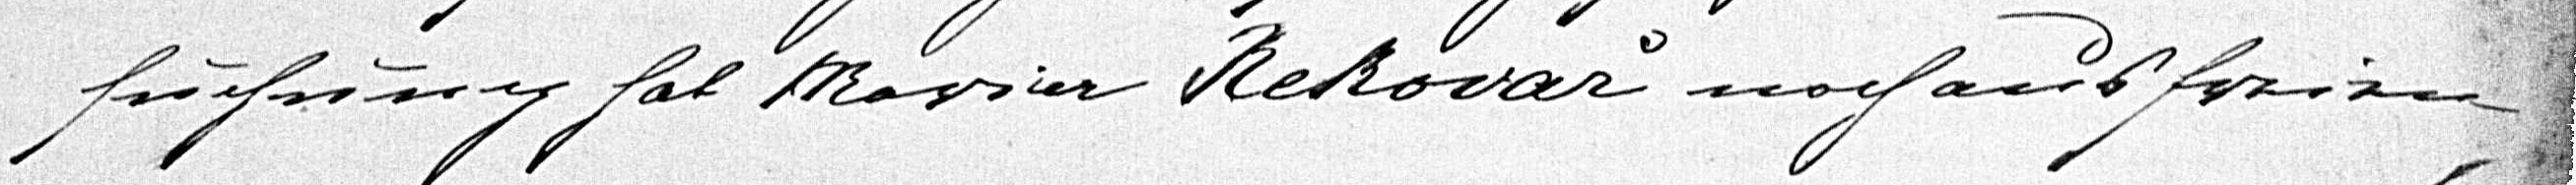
suchung hat Maria Nekovař noch aus freien
